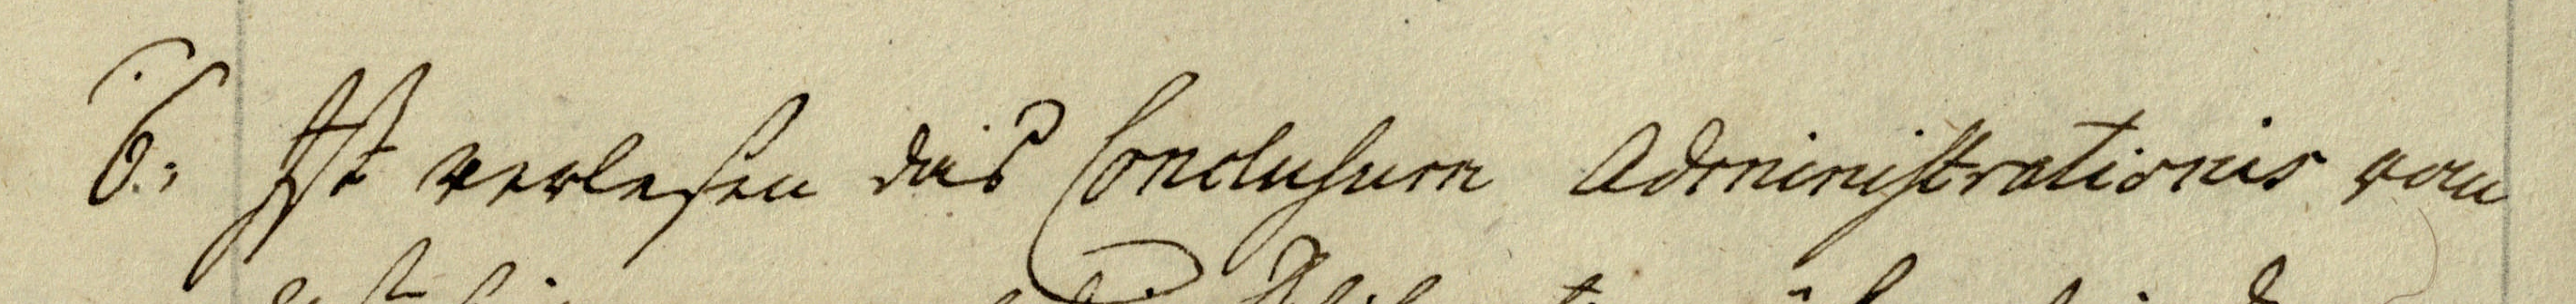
6., Ist verlesen das Conclusum Administrationis vom
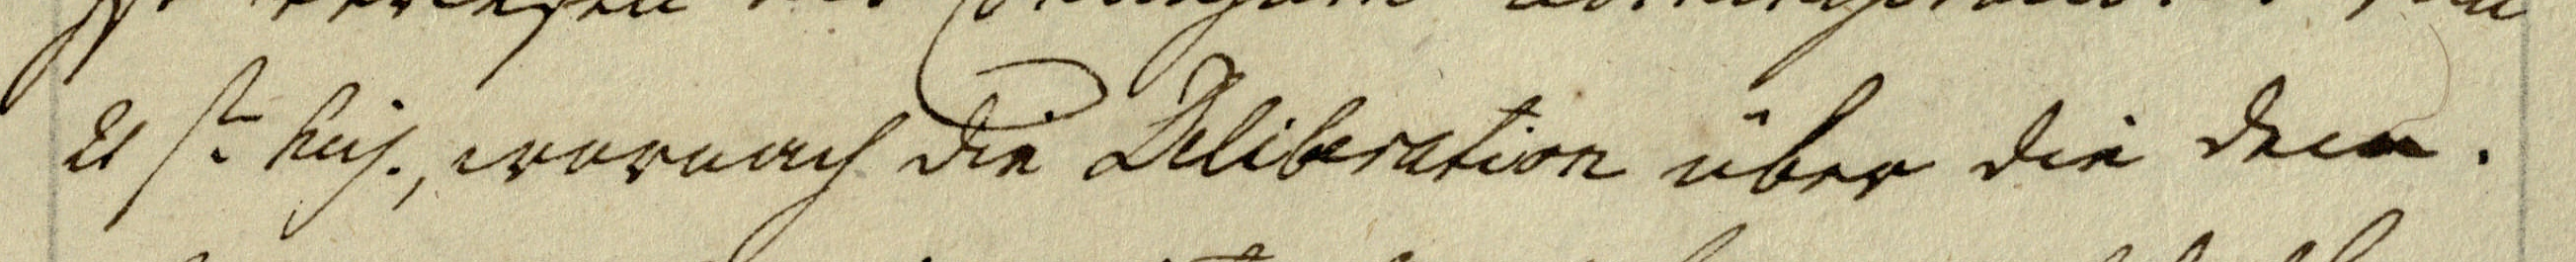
21 st. huj., wornach die Deliberation über die dem¬
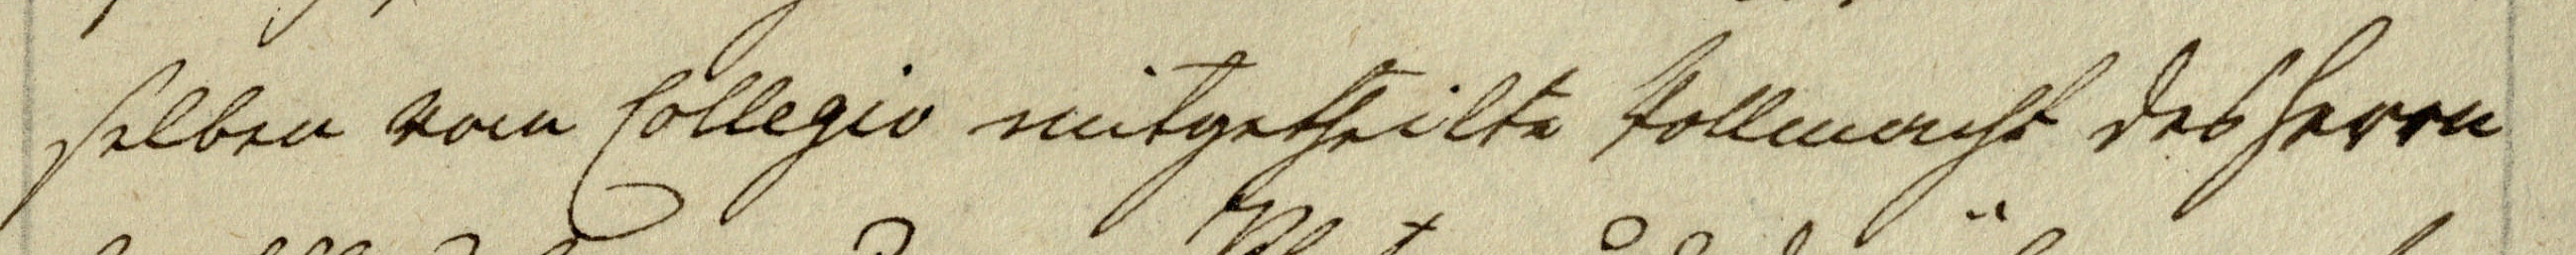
selben vom Collegio mitgetheilte Vollmacht des Herrn
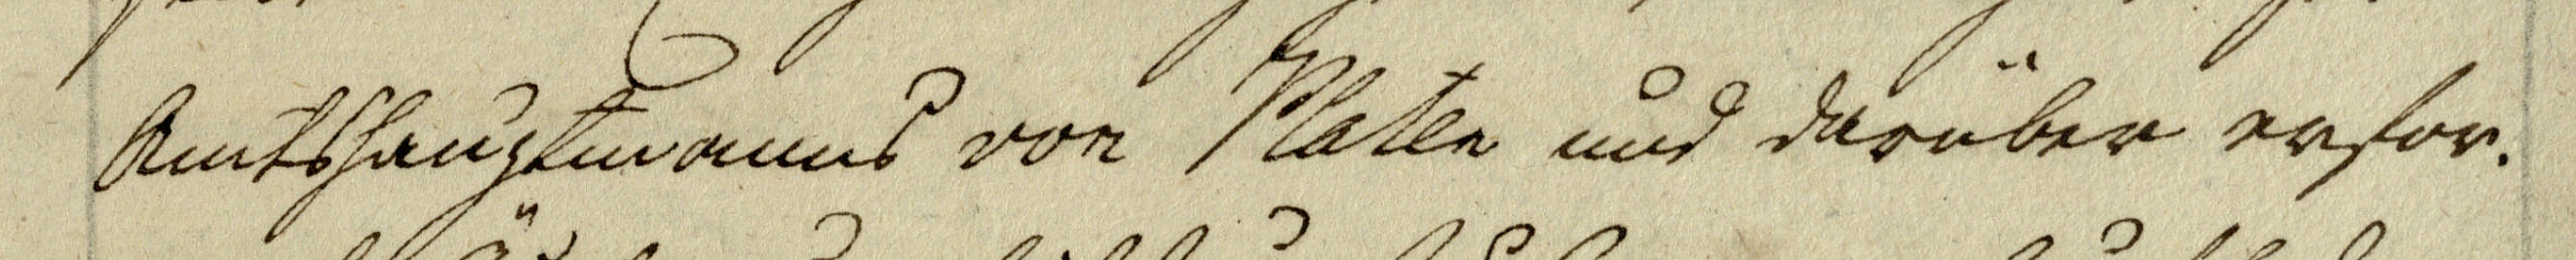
Amtshauptmanns von Platen und darüber erfor¬
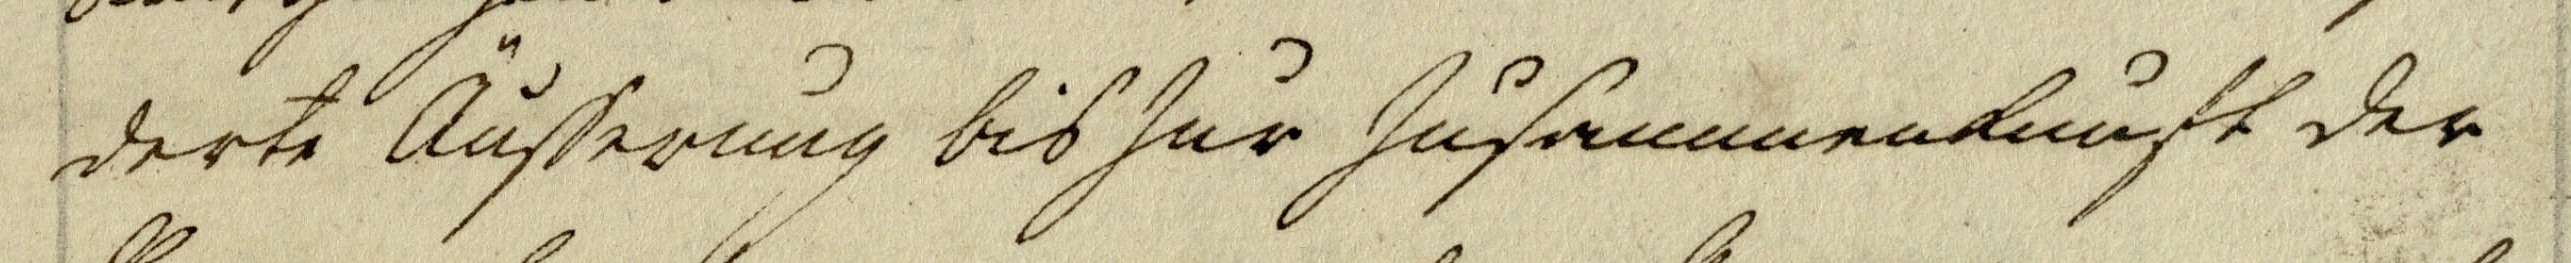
derte Äusserung bis zur Zusammenkunft der
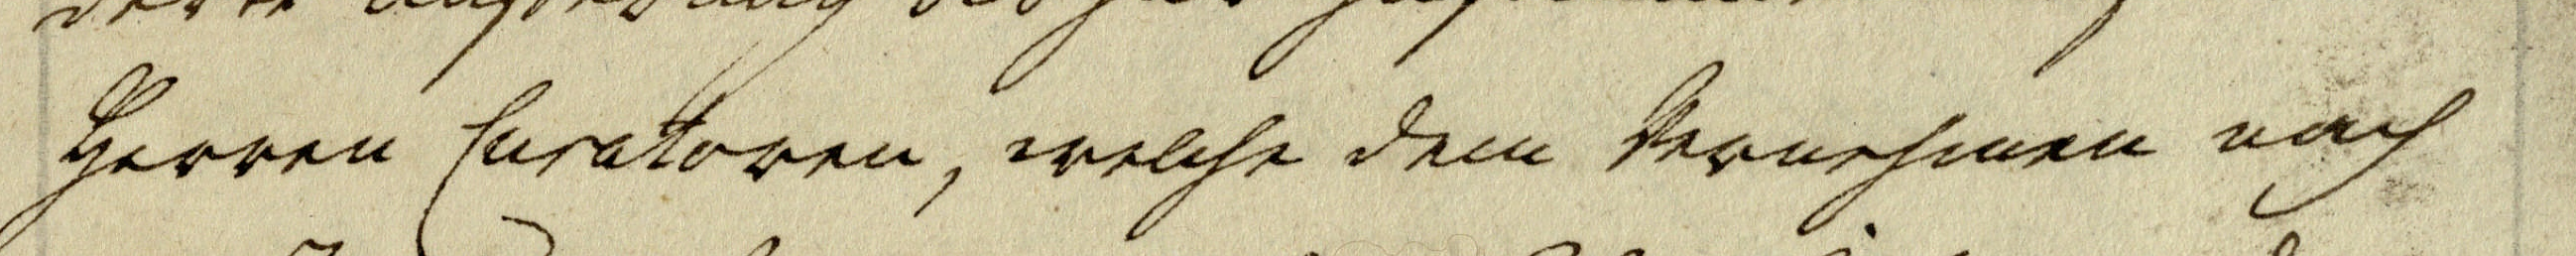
Herren Curatoren, welche dem Vernehmen nach
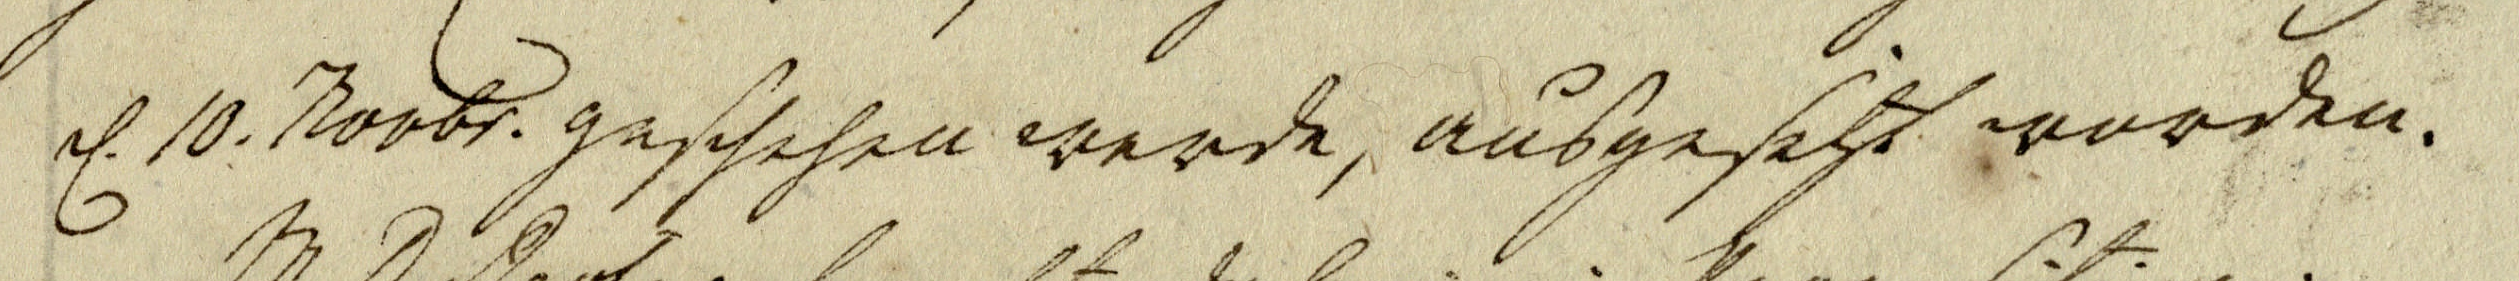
d. 10. Novbr. geschehen werde, ausgesetzt worden.
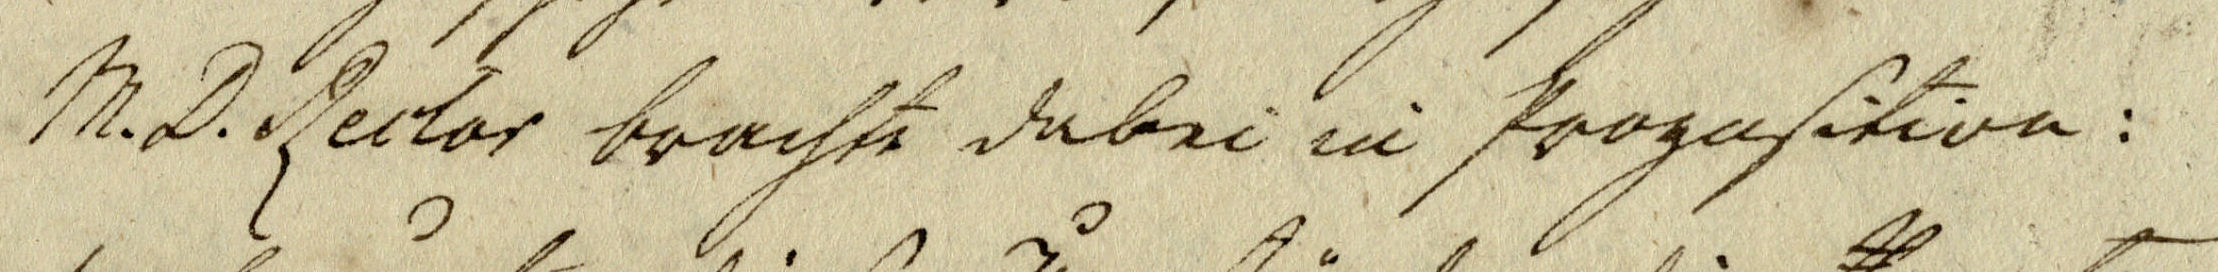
M. D. Rector brachte dabei in Proposition:
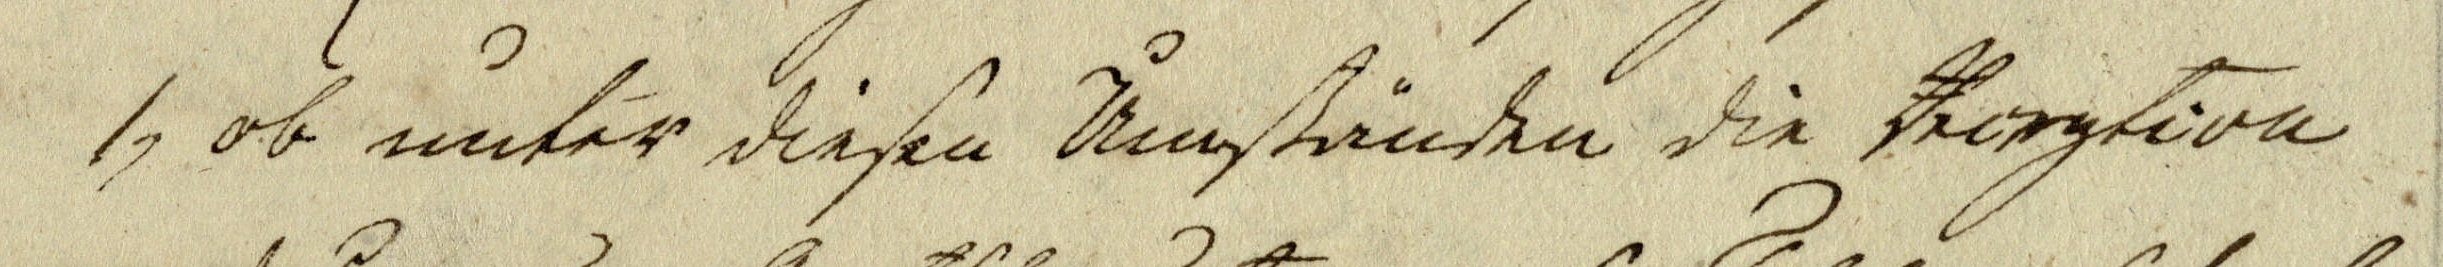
1, ob unter diesen Umständen die Reception
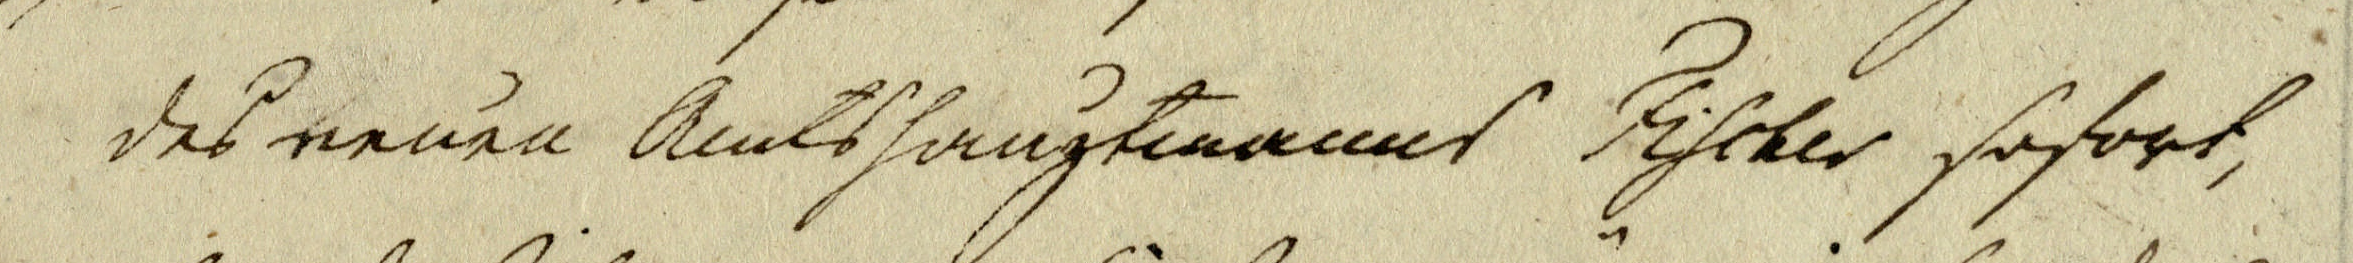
des neuen Amtshauptmanns Fischer sofort,
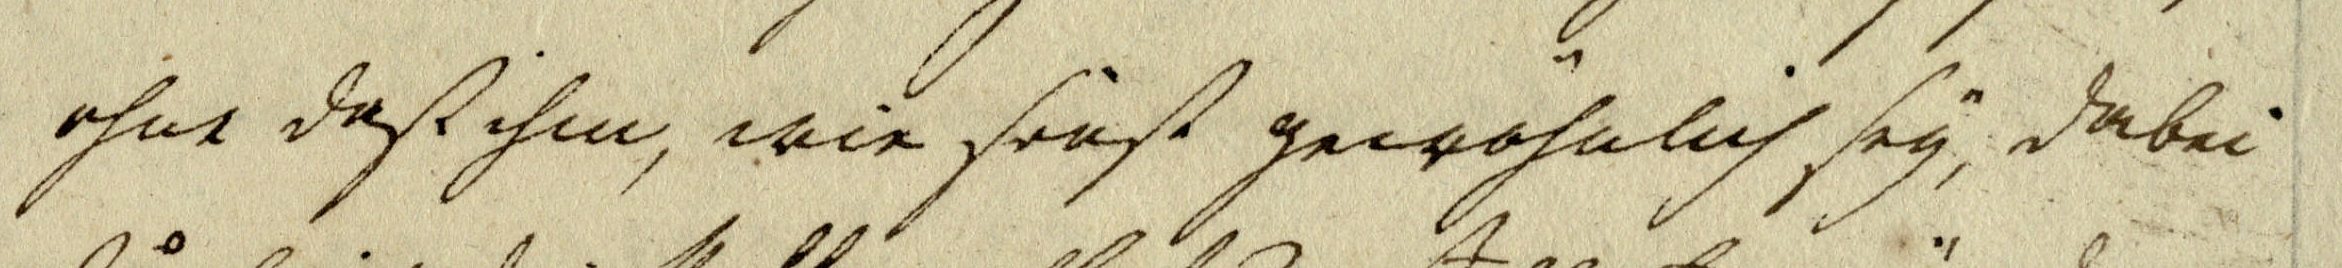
ohne daß ihm, wie sonst gewöhnlich seÿ, dabei
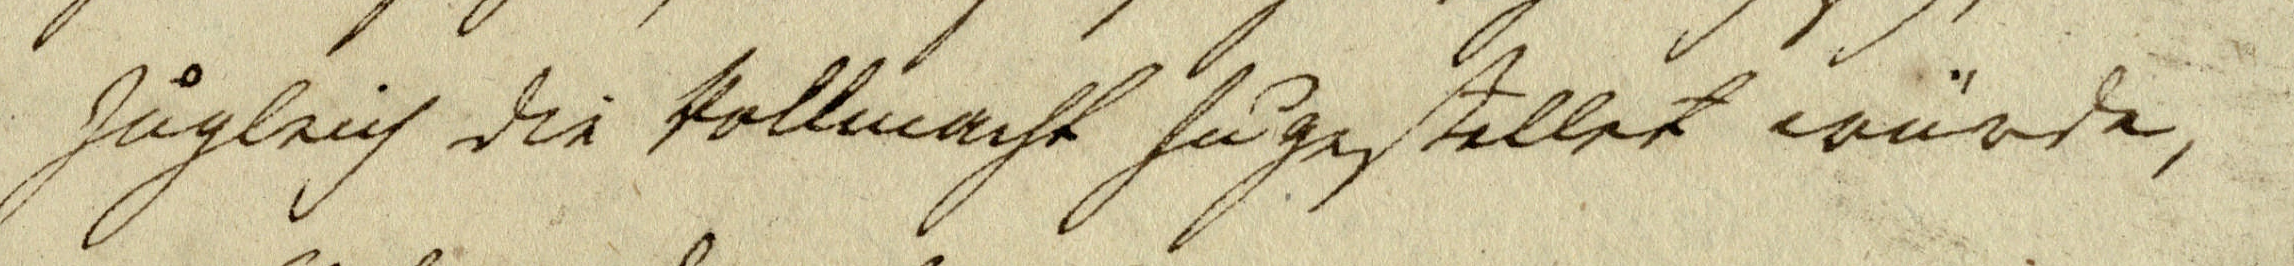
zugleich die Vollmacht zugestellet würde,
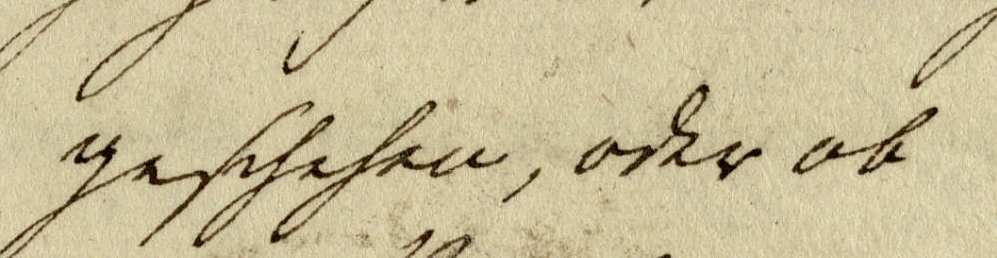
geschehen, oder ob
